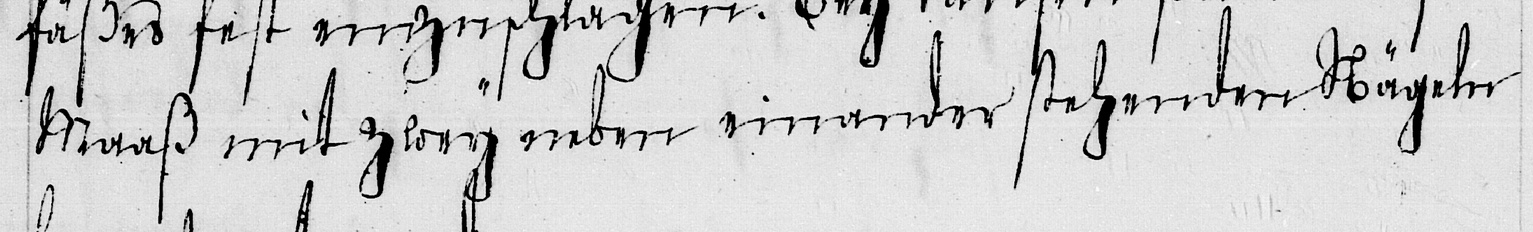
Maaß mit zwey neben einander stehenden Nägeln
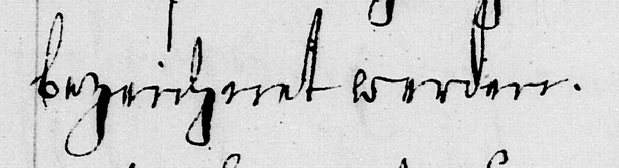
bezeichnet werden.
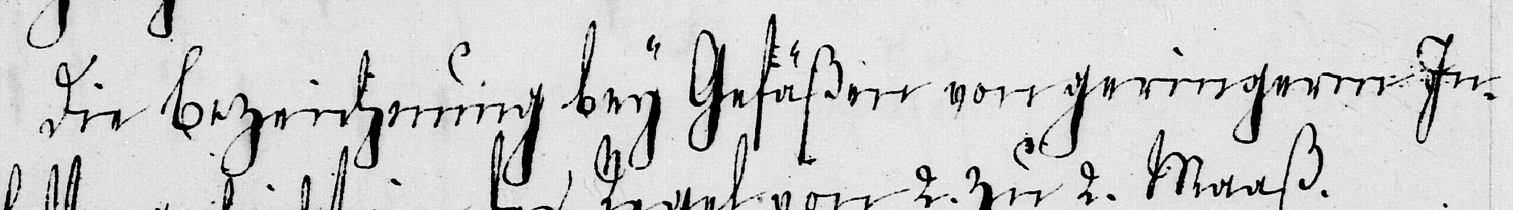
Die Bezeichnung bey Gefäßen von geringerem In¬
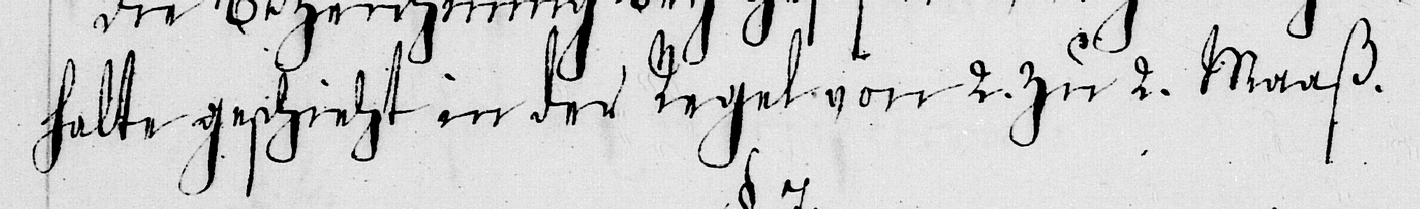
halte geschieht in der Regel von 2. zu 2. Maaß.
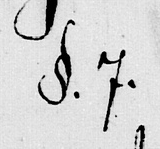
§. 7.
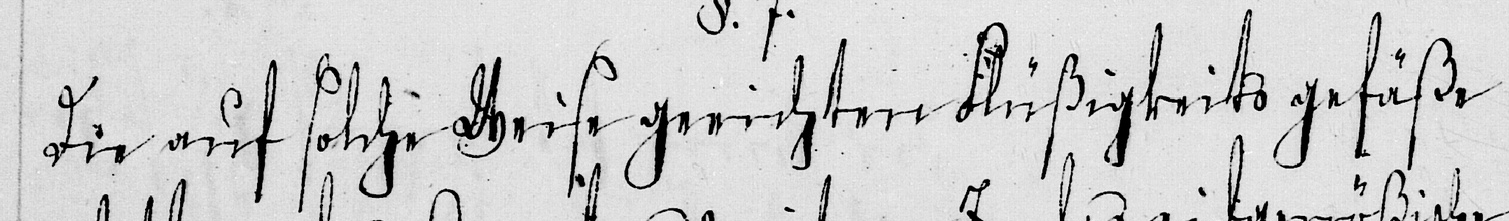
Die auf solche Weise geeichten Flüßigkeitsgefäße
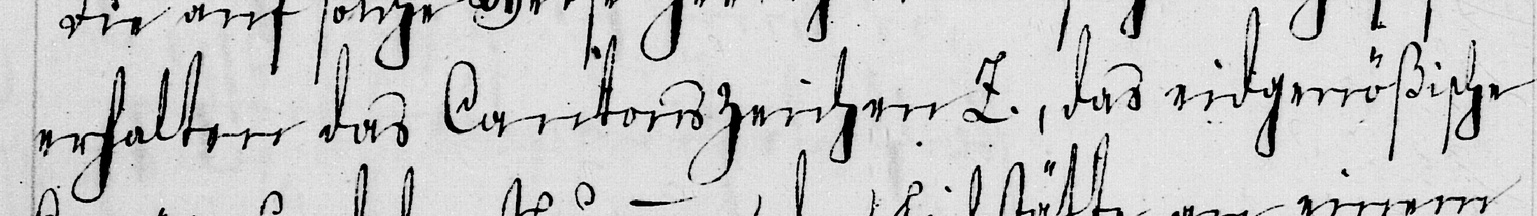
erhalten das Cantonszeichen Z., das eidgenößische
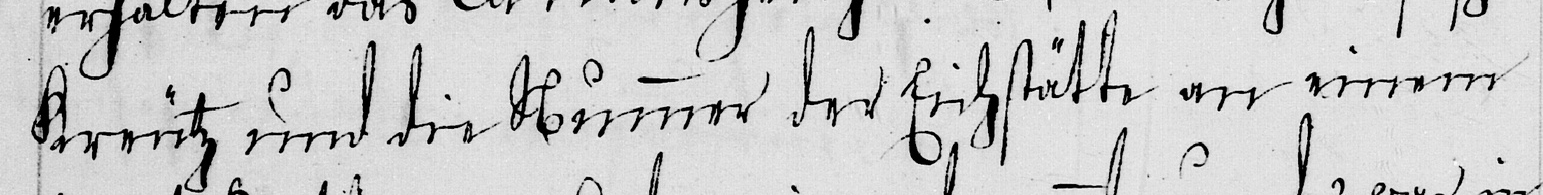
Kreutz und die Nummer der Eichstätte an einem
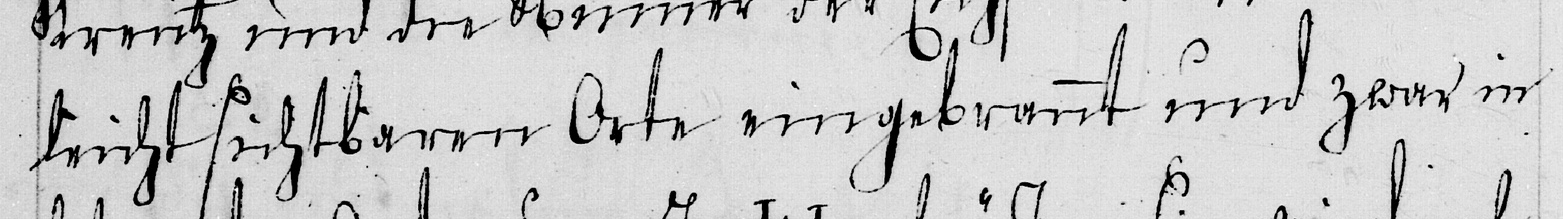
leicht sichtbaren Orte eingebrannt und zwar in
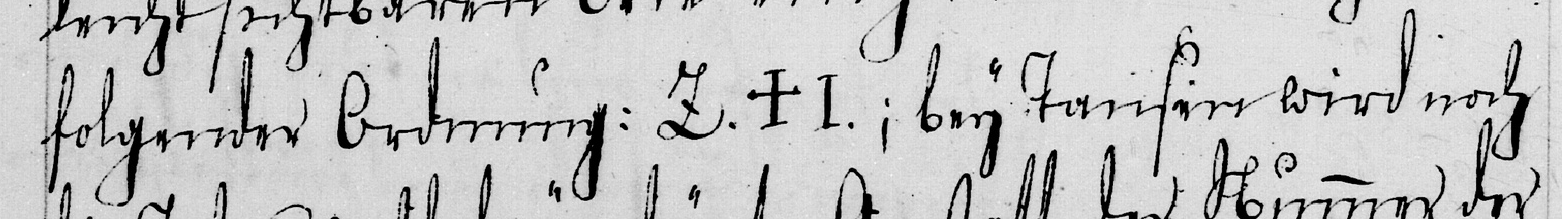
folgender Ordnung: Z. + I. ; bey Tansen wird noch
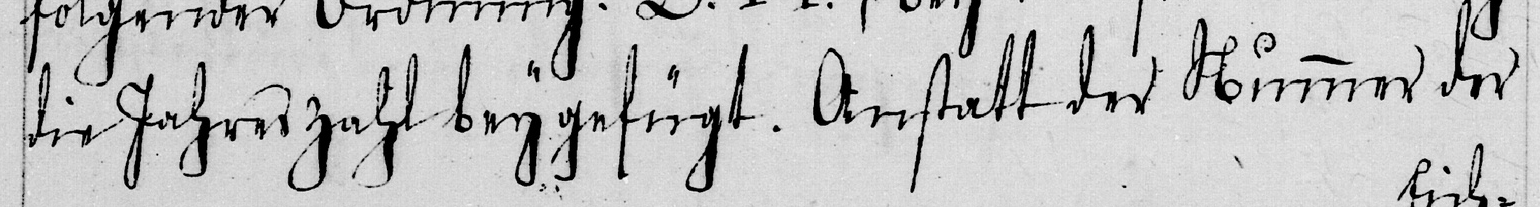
die Jahreszahl beygefügt. Anstatt der Nummer der
